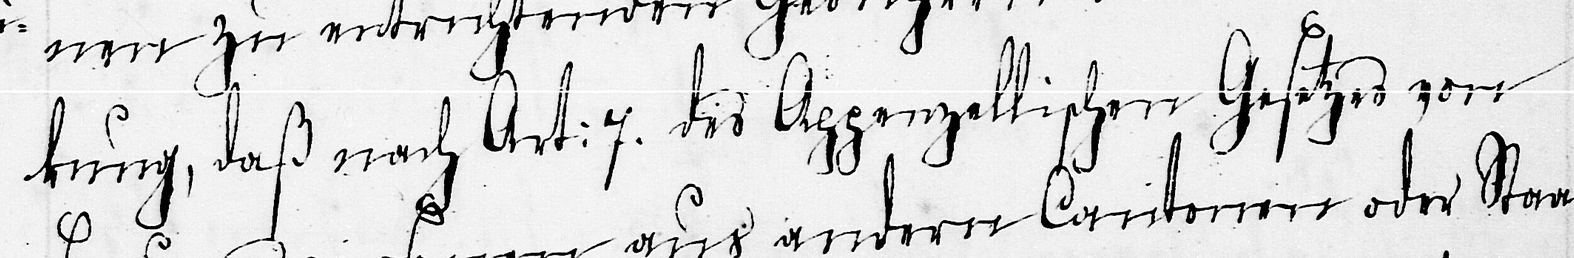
kung, daß nach Art: 7. des Appenzellischen Gesetzes von
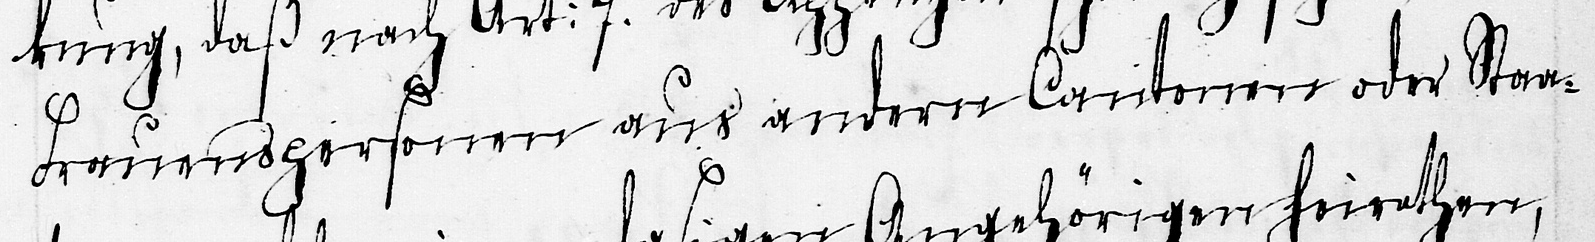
Frauenspersonen aus andern Cantonen oder Staa¬
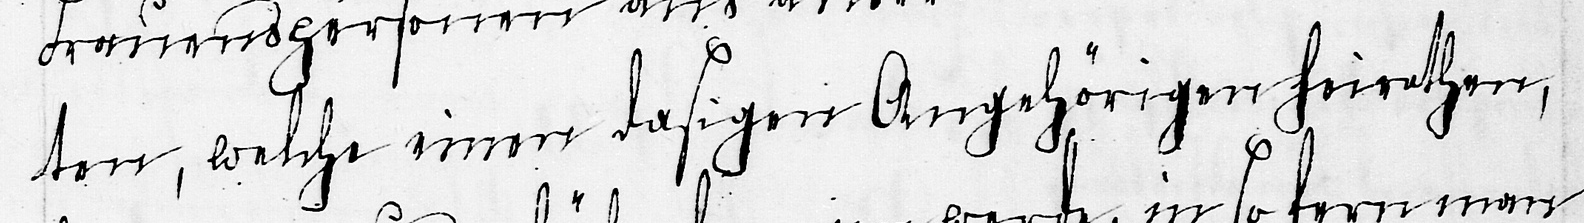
ten, welche einen dasigen Angehörigen heirathen,
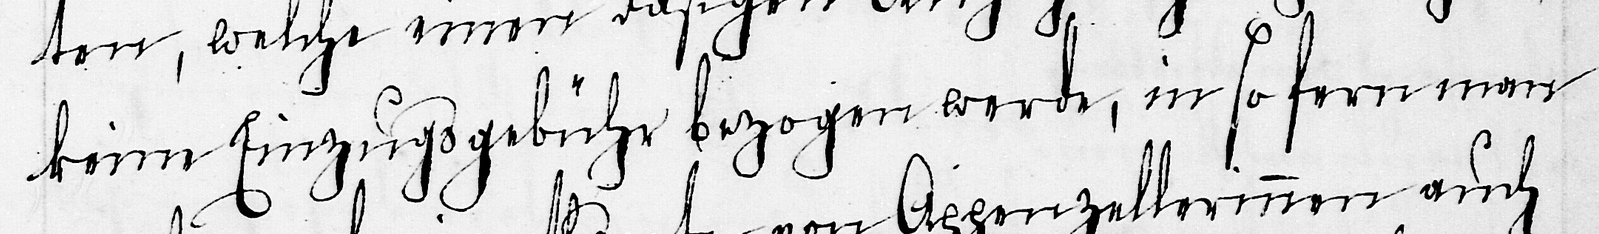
keine Einzugsgebühr bezogen werde, in so fern man
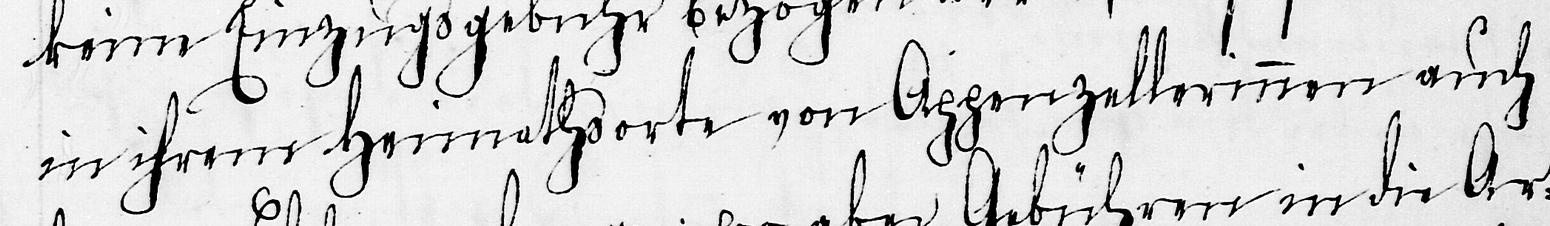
in ihrem Heimathsorte von Appenzellerinnen auch
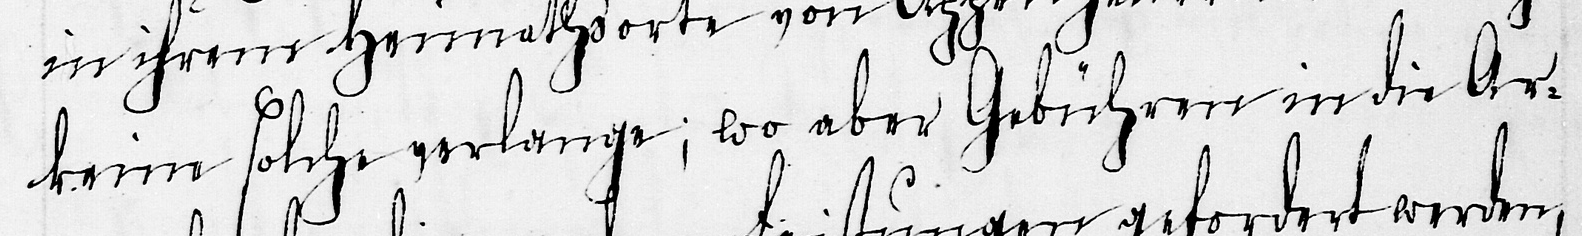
keine solche verlange; wo aber Gebühren in die Ar¬
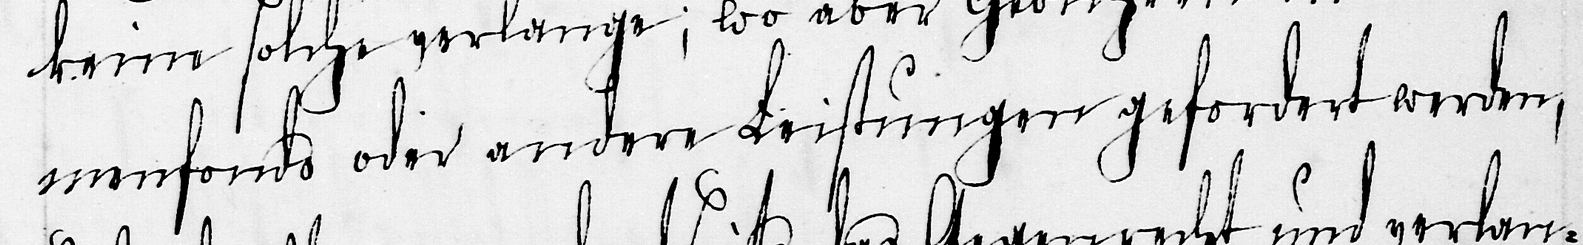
menfonds oder andere Leistungen gefordert werden,
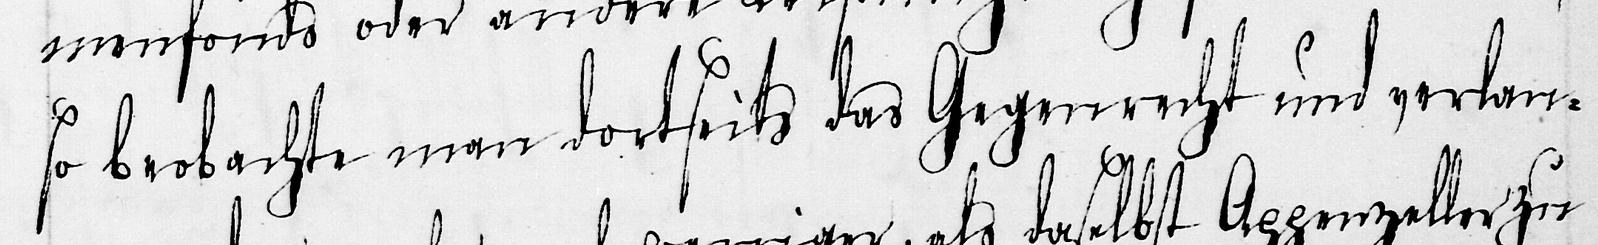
so beobachte man dortseits das Gegenrecht und verlan¬
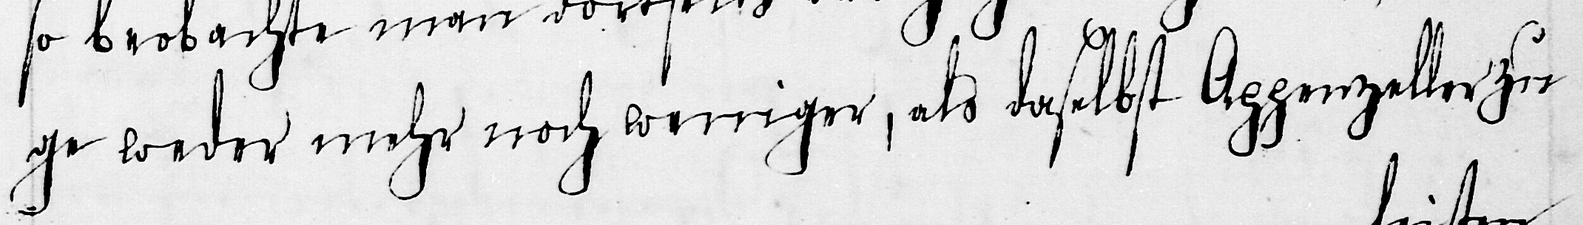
ge weder mehr noch weniger, als daselbst Appenzeller zu
